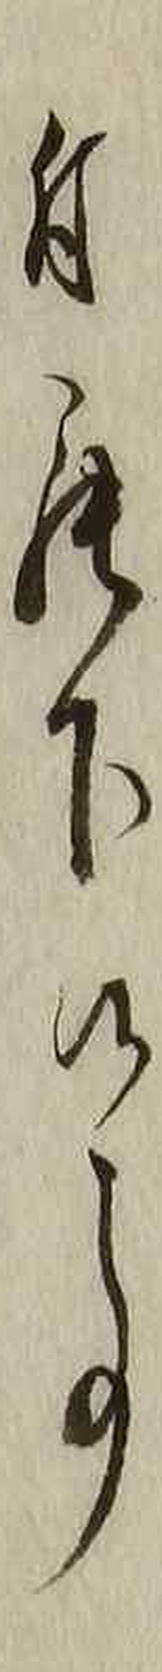付罷下候事
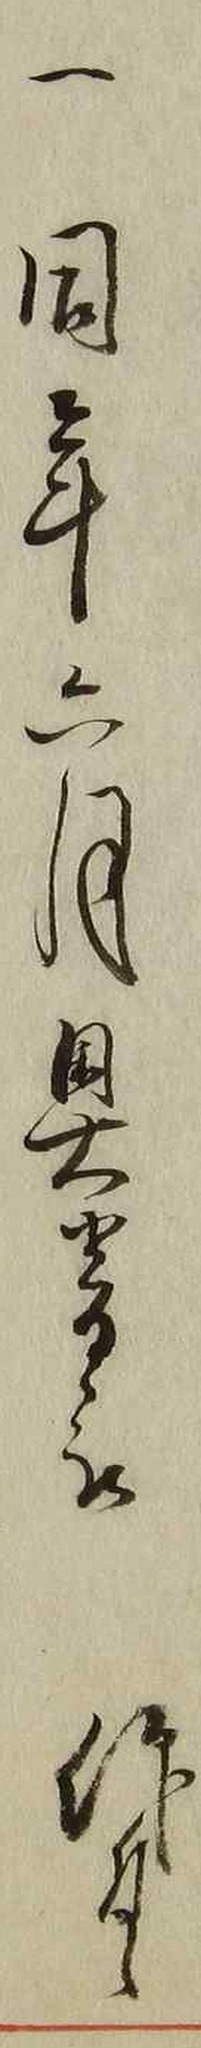一同年六月奥番被仰付候
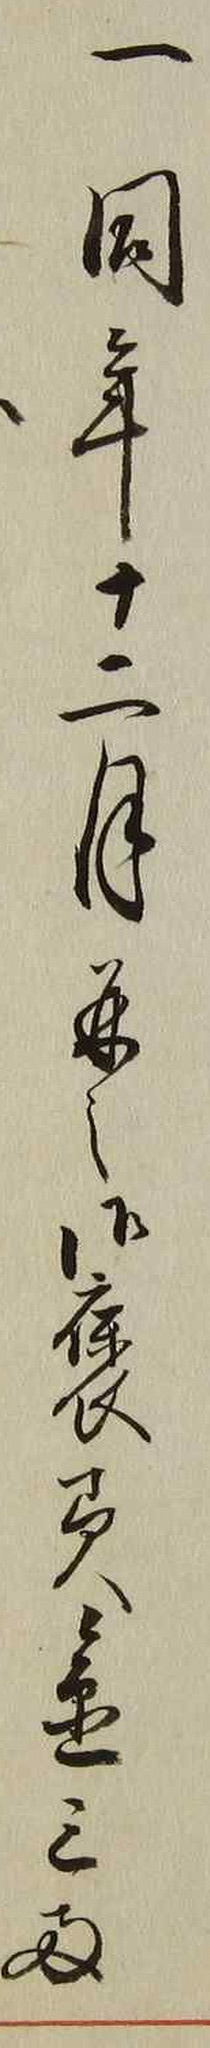一同年十二月再之御褒美金三両
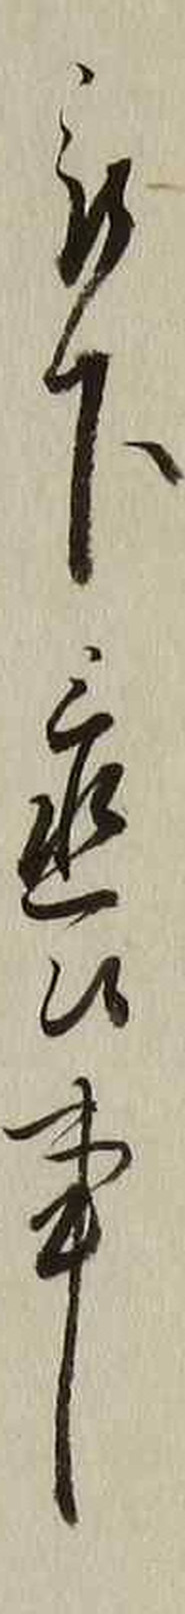被下置候事
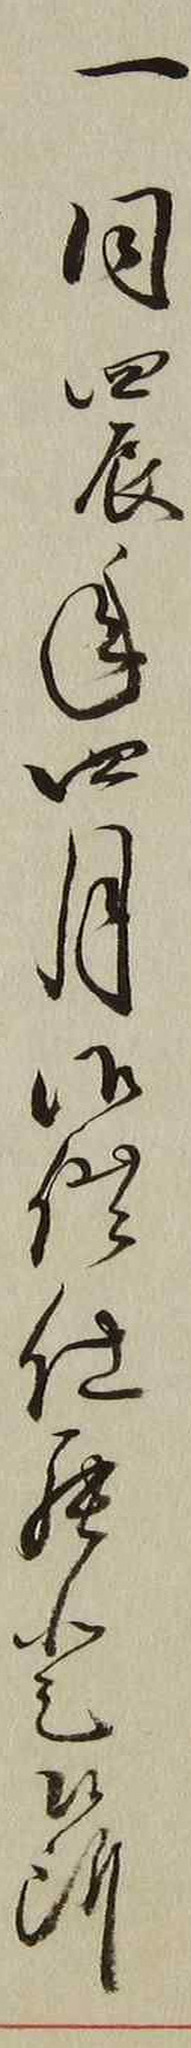一同四辰年四月御供仕罷登候所
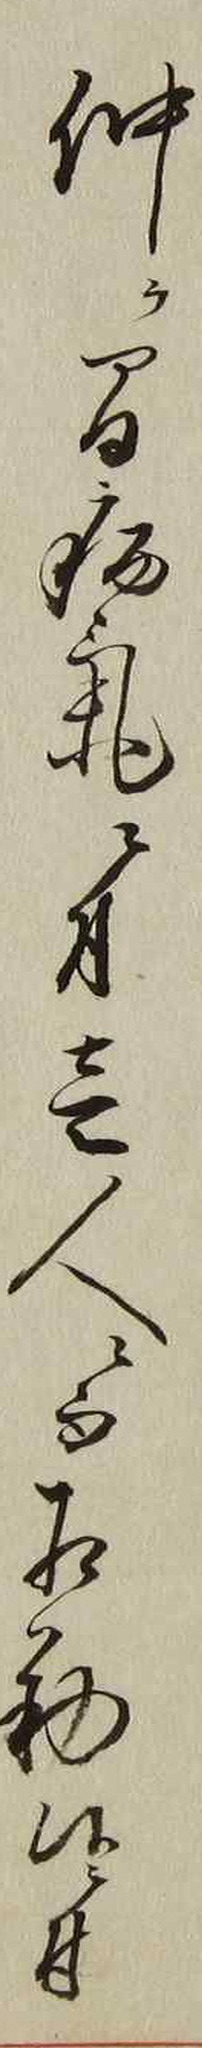仲ケ間病気ニ付壱人ニ而相勤候ニ付
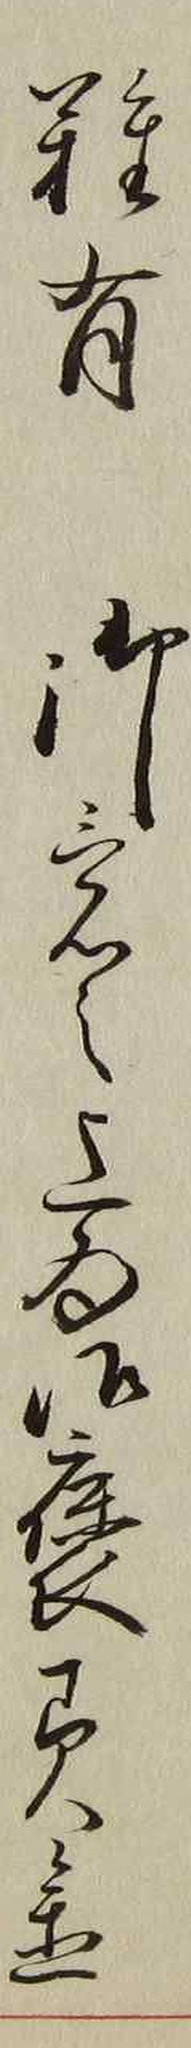難有御意之上為御褒美金
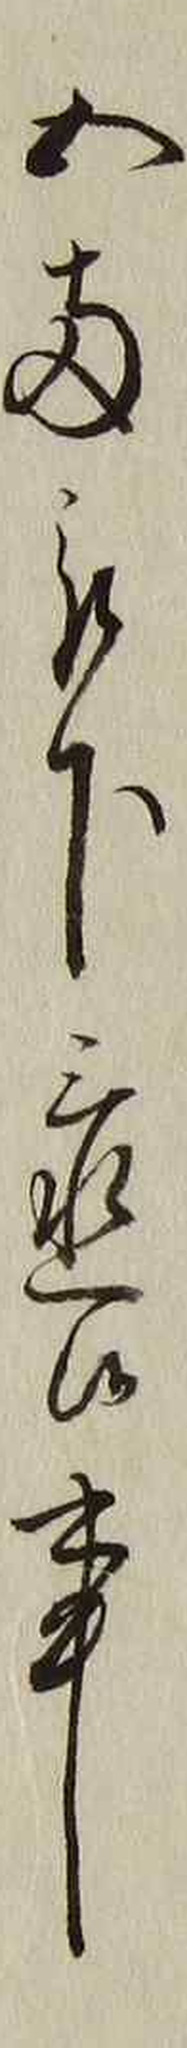五両被下置候事
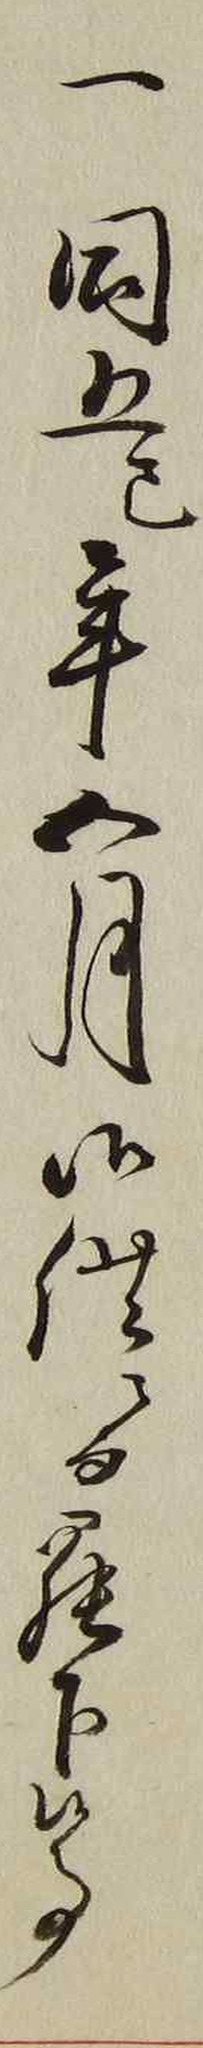一同五巳年五月御供ニ而罷下候事
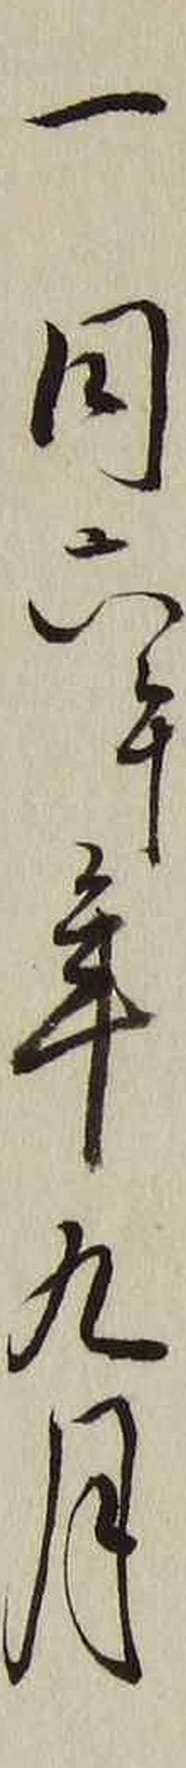一同六午年九月
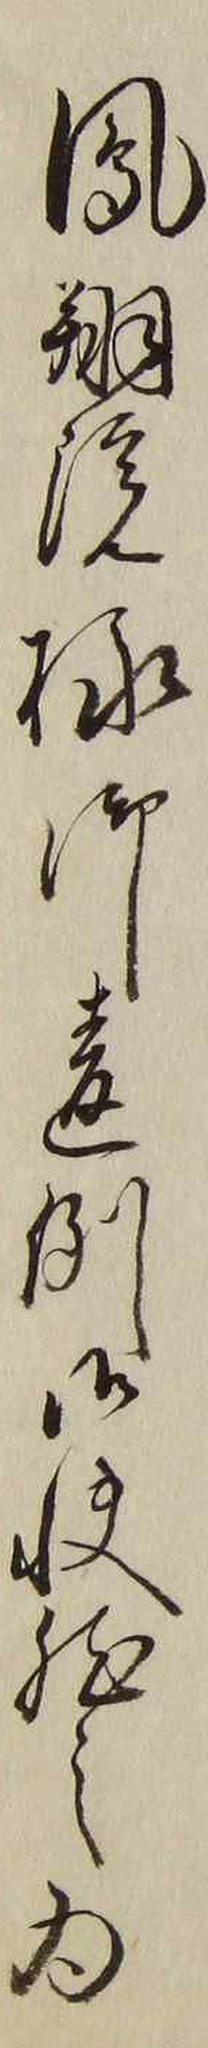鳳翔院様御違例御快然之為

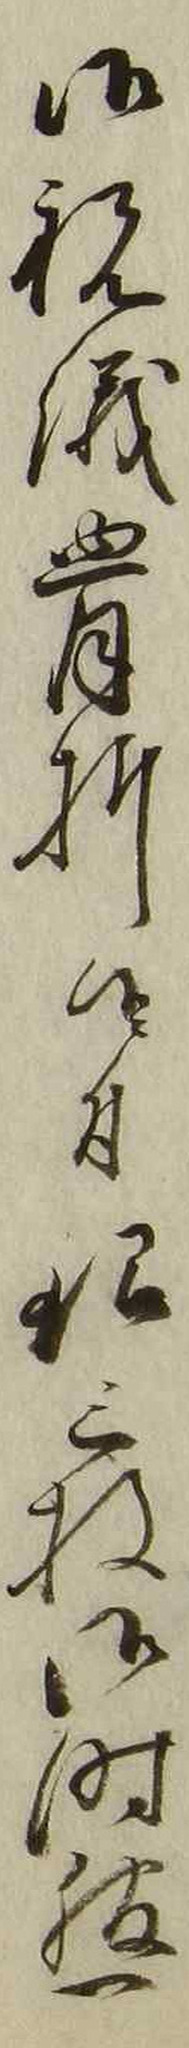御祝儀骨折候ニ付銀三枚御時服一
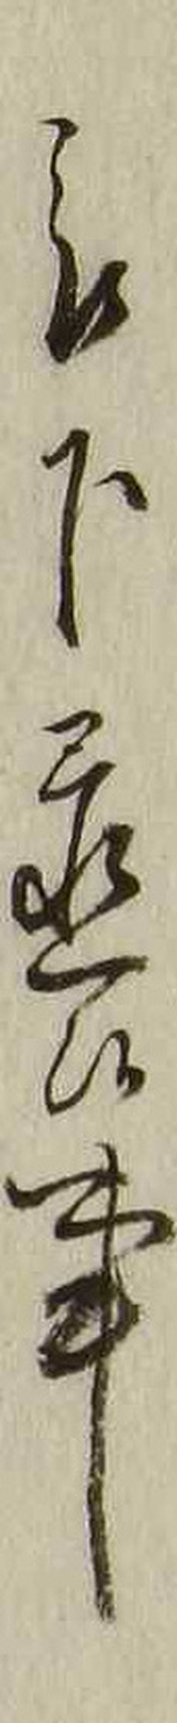被下置候事
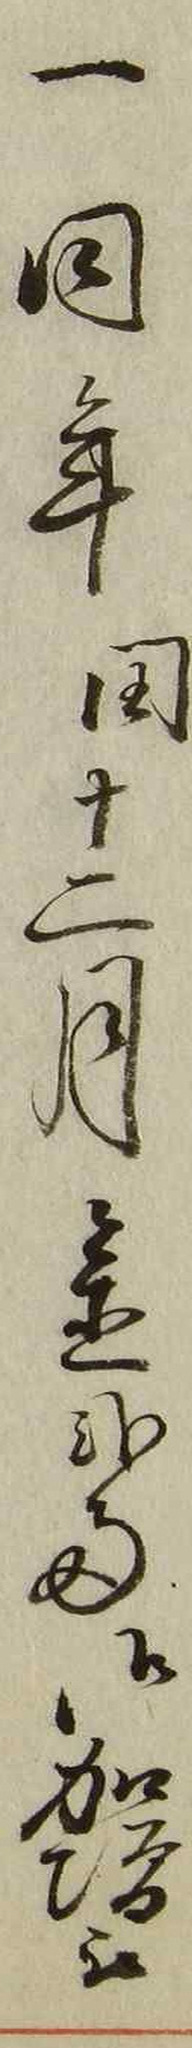一同年閏十二月金弐両御加増被
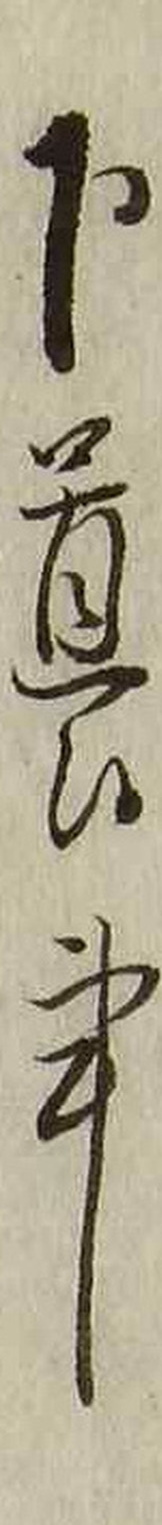下置候事
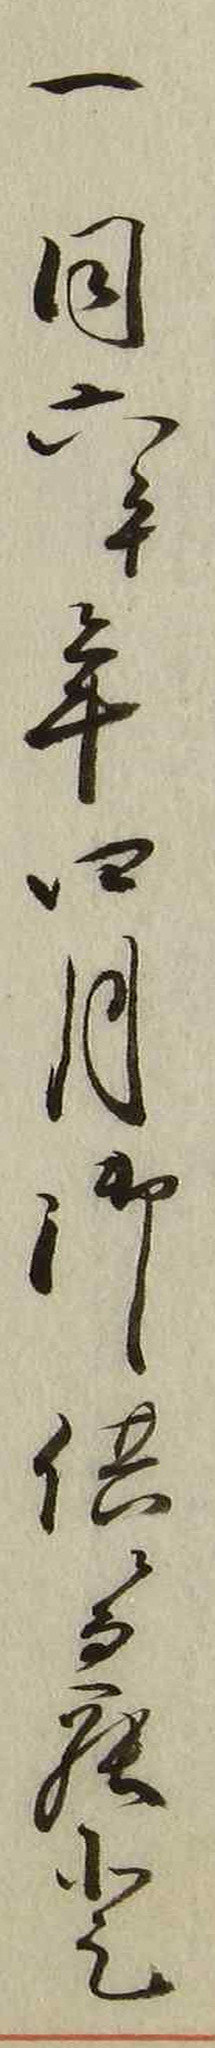一同六午年四月御供ニ而罷登
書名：諸士系譜　巻之2　い之部2
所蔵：会津若松市立会津図書館
